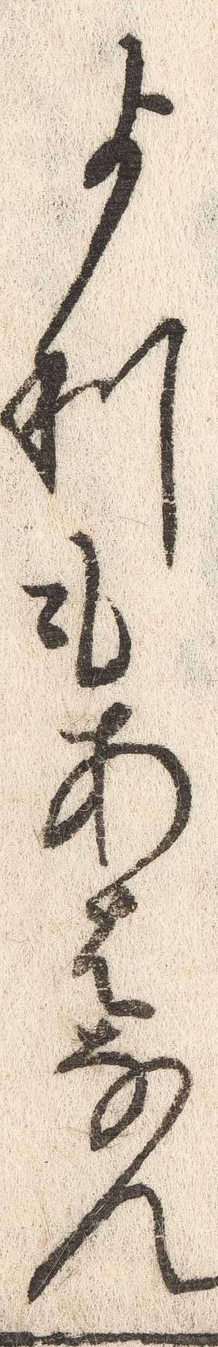よりもあはなん

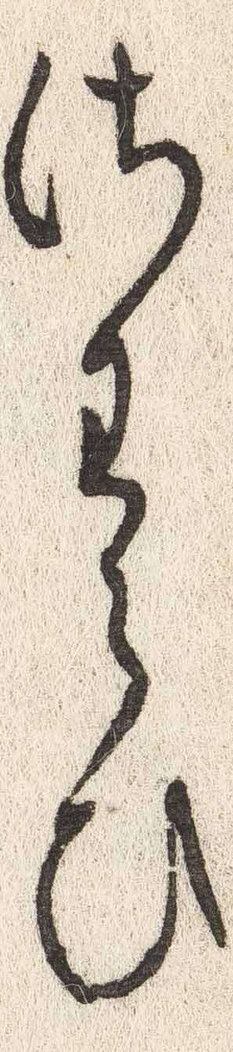さわらひ
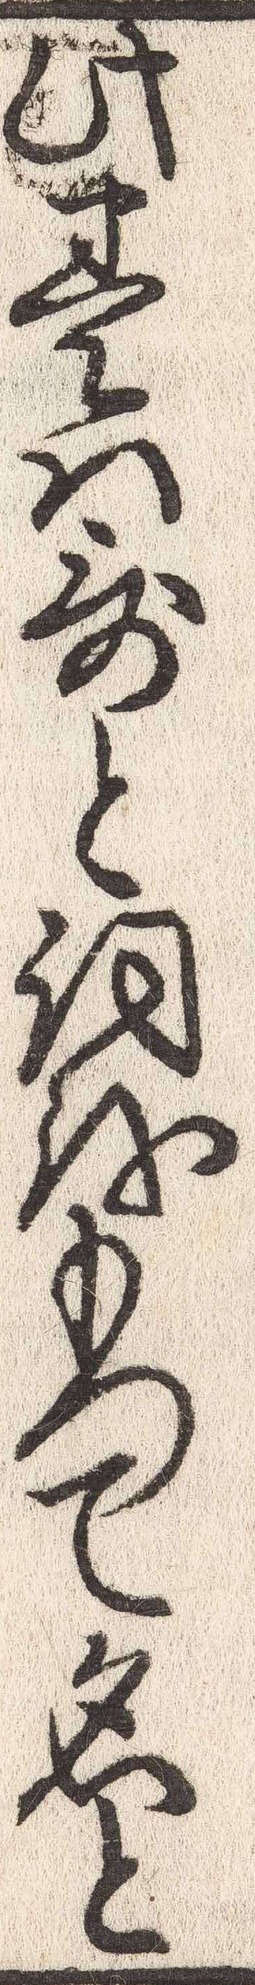此巻は哥と詞を持つて名と
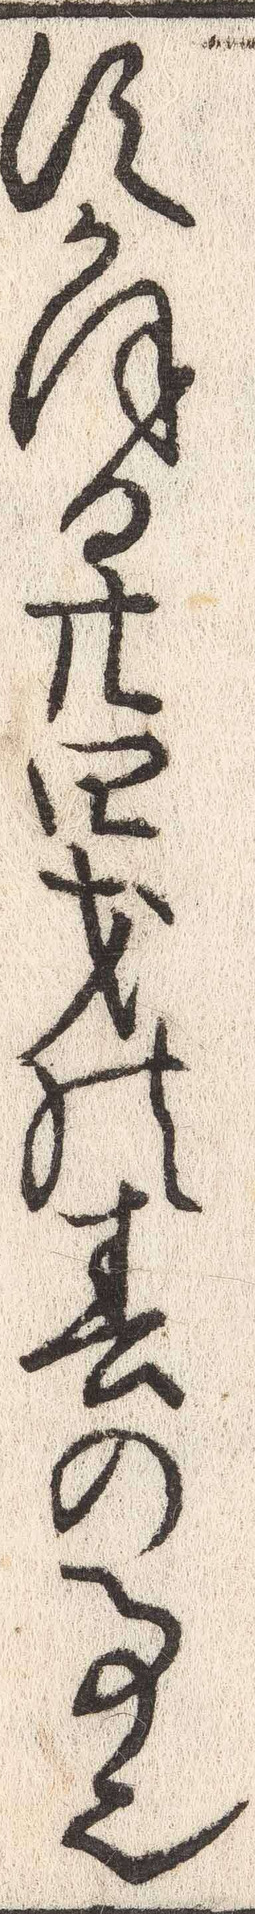すかほる廿四才の春の事也
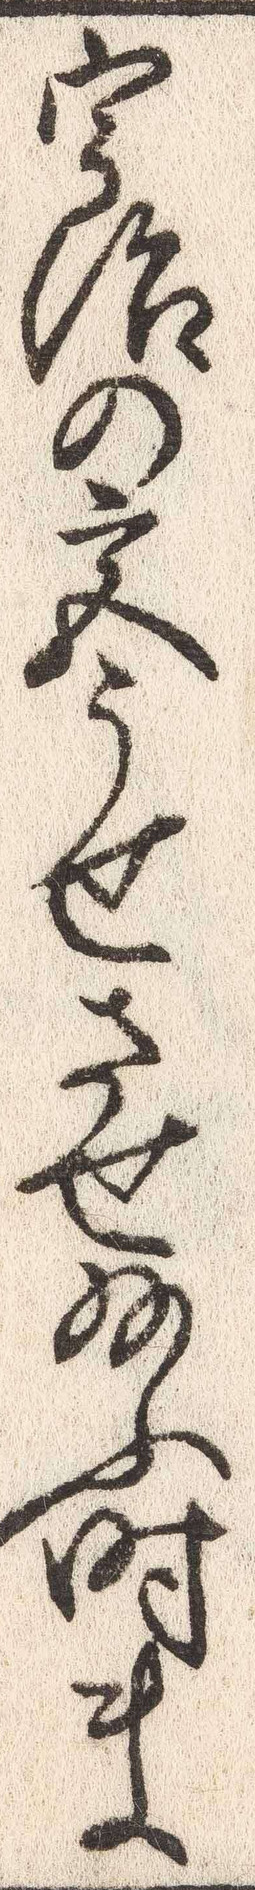宇治の宮うせさせ給ふ時ま
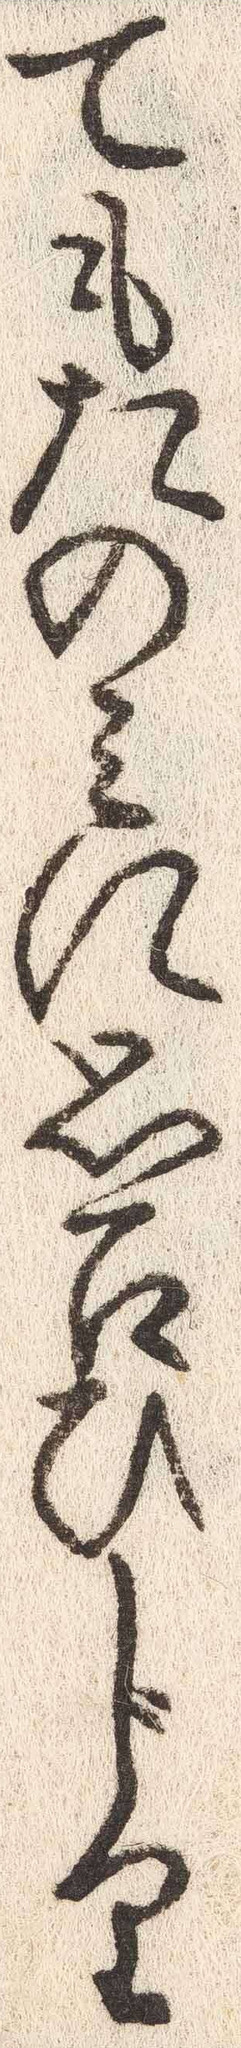てもたのみに思召ひじり
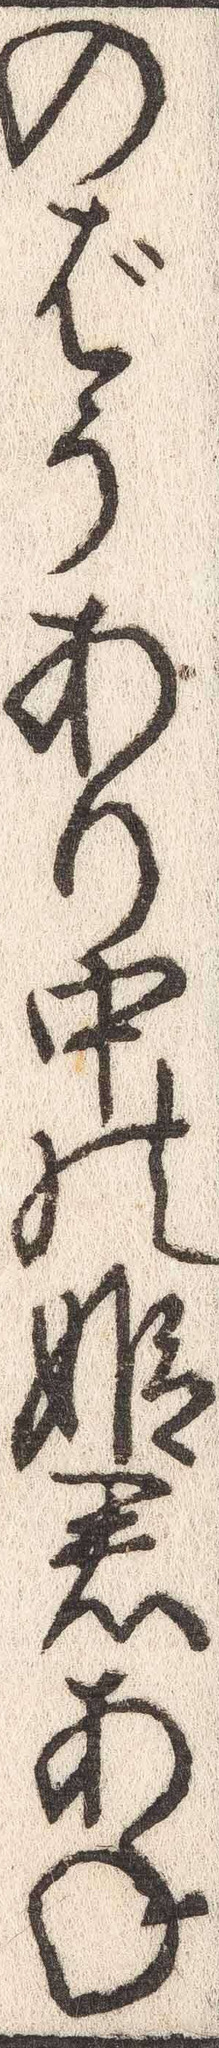のばうあり中の姫君あね
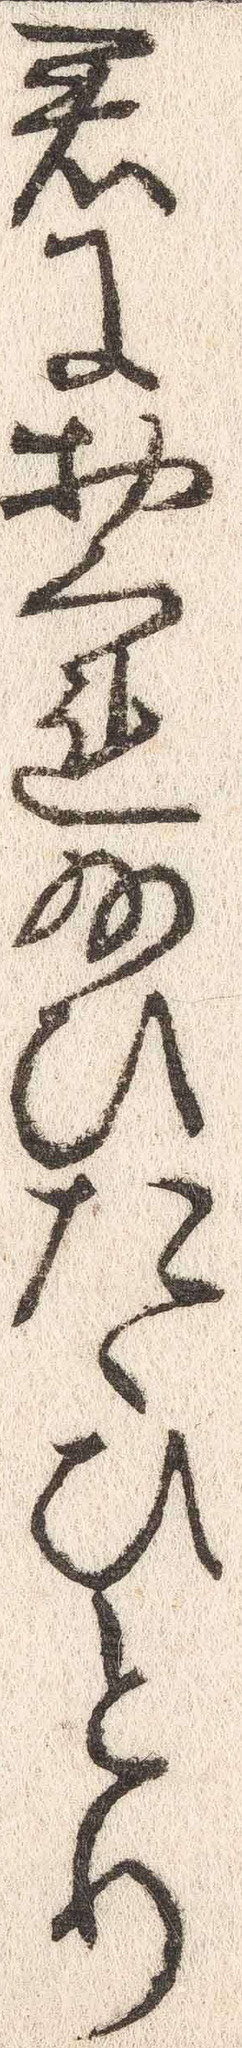君におくれ給ひたゝひとり
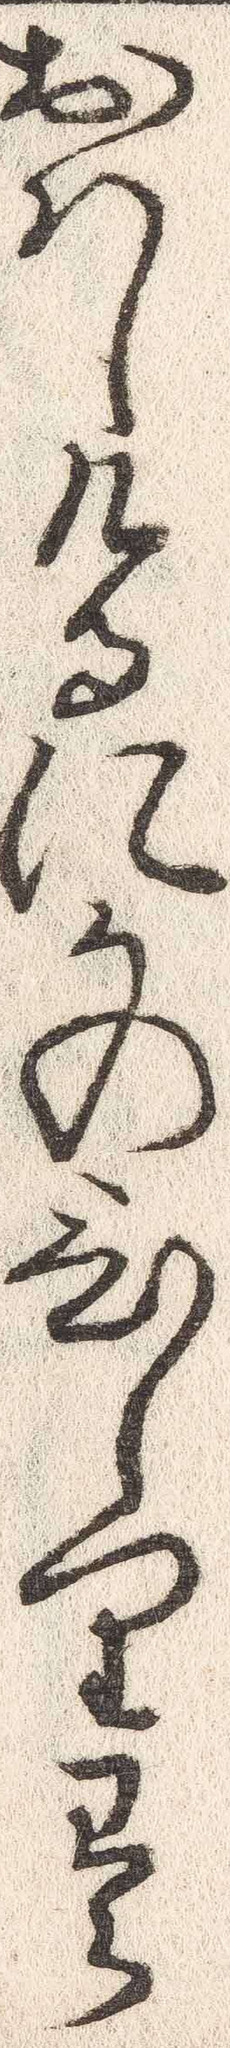おはしけるにかのひしりわら
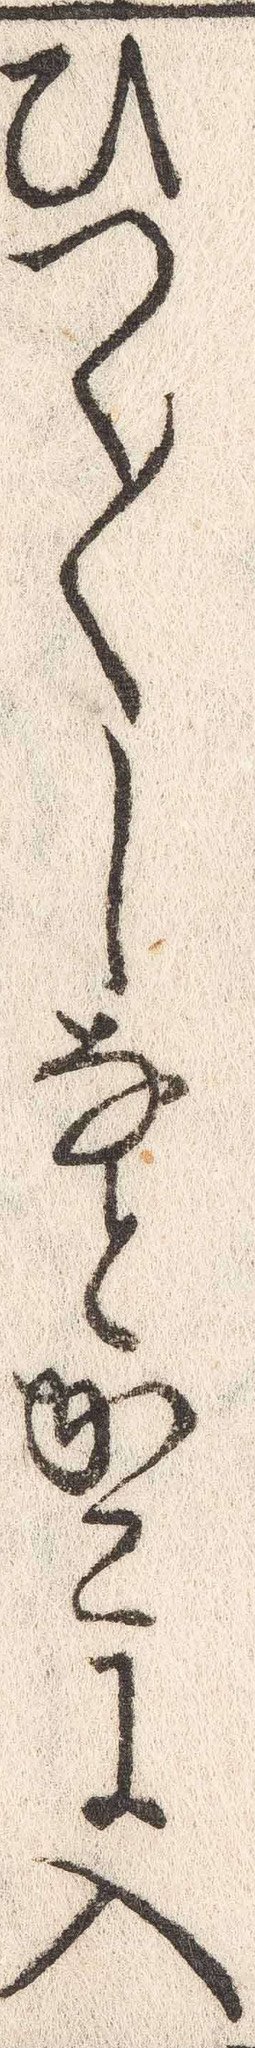ひつく〳〵しなとかこに入
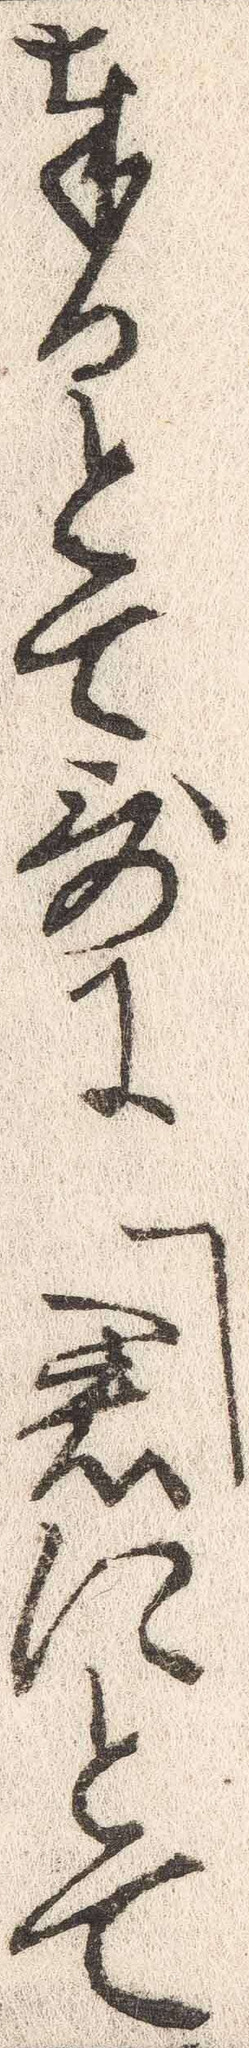奉るとて哥に〽︎君にとて

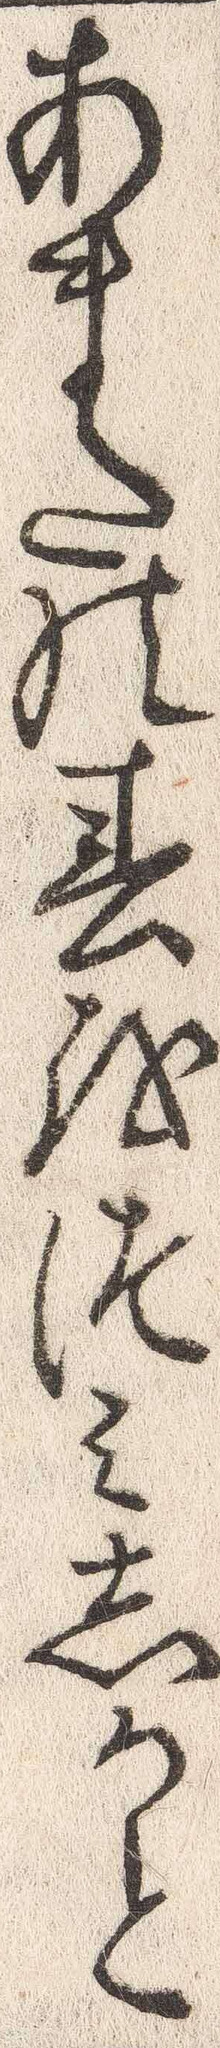あまたの春をつみしかと
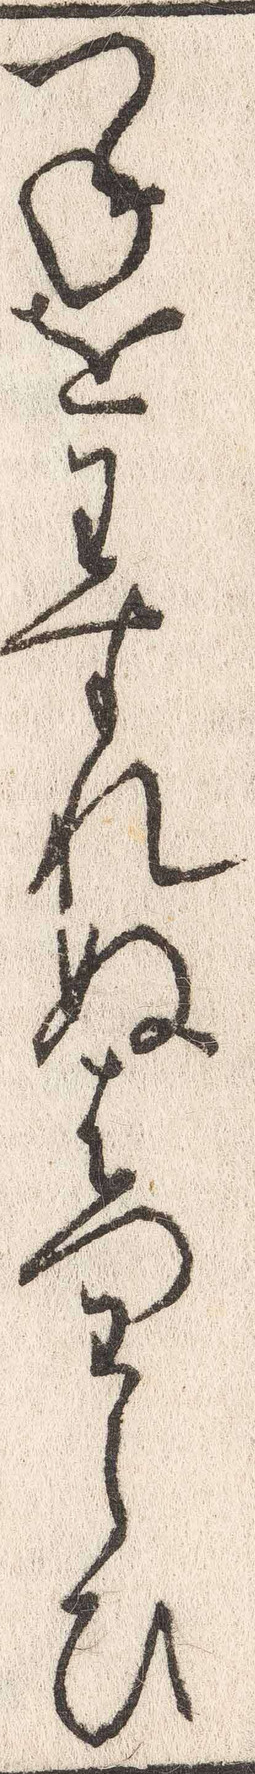つねをわすれぬはつわらひ
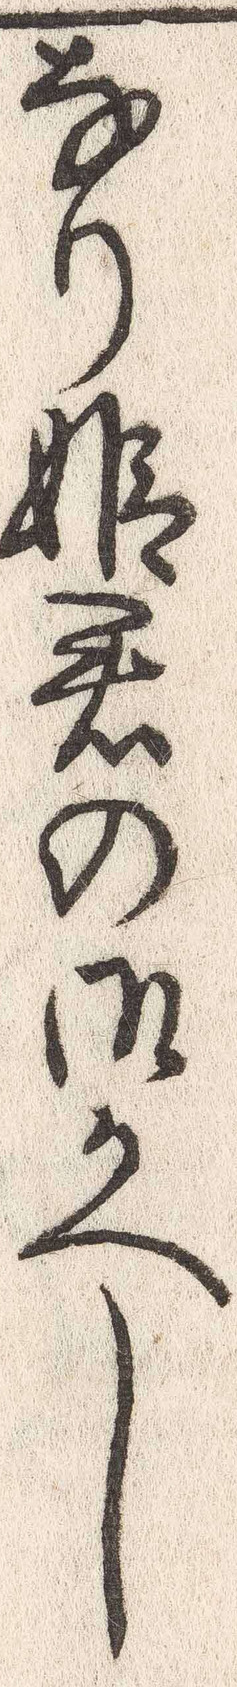なり姫君の御かへし
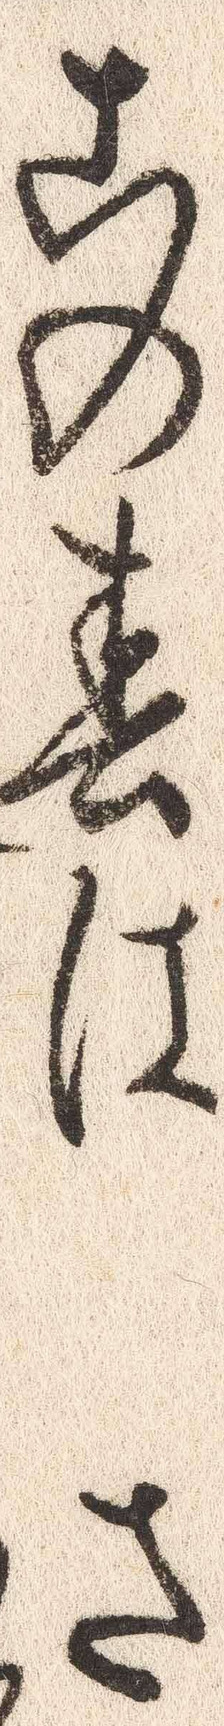この春はさ
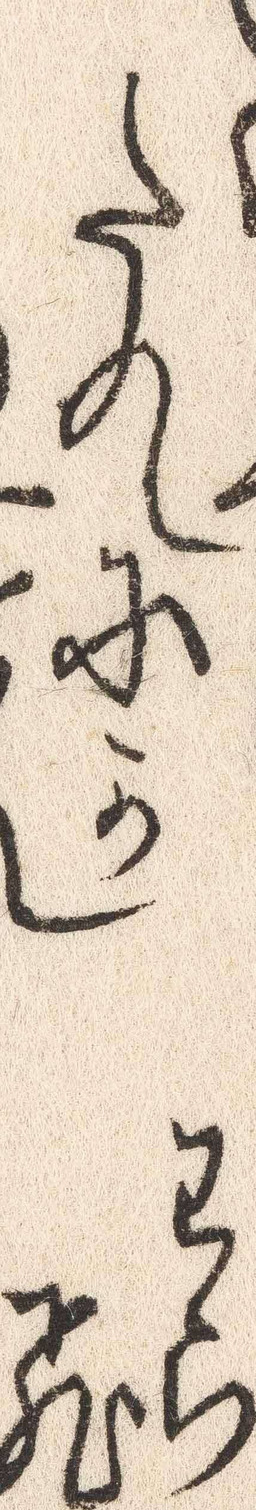たれにかわら
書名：源氏物語
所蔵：東京学芸大学附属図書館 国文学研究資料館
